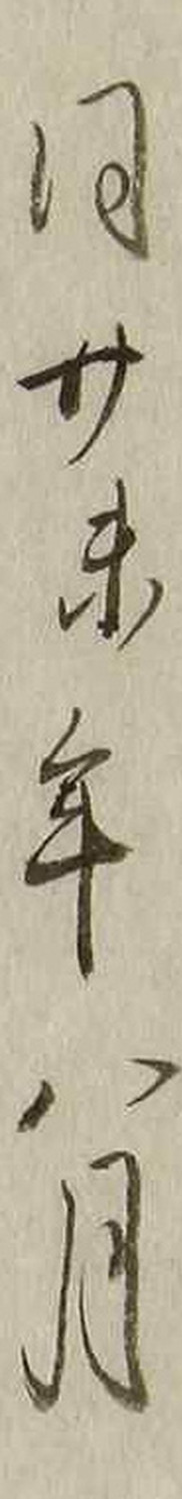一同廿未年八月
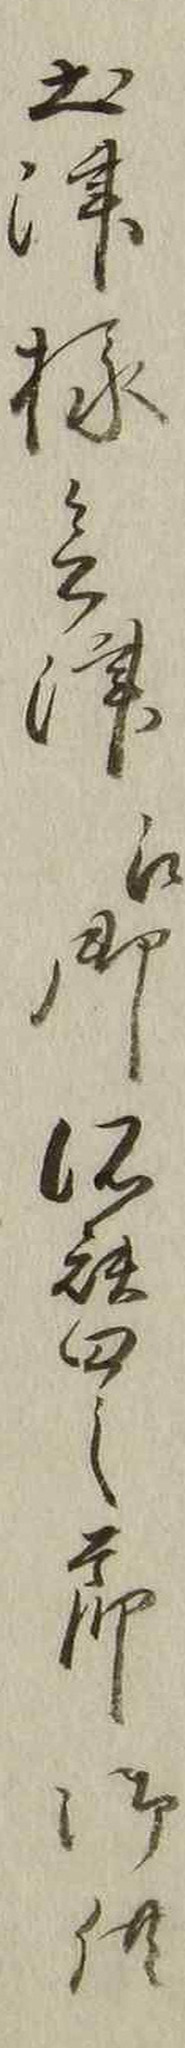土津様会津江御所替之節御供
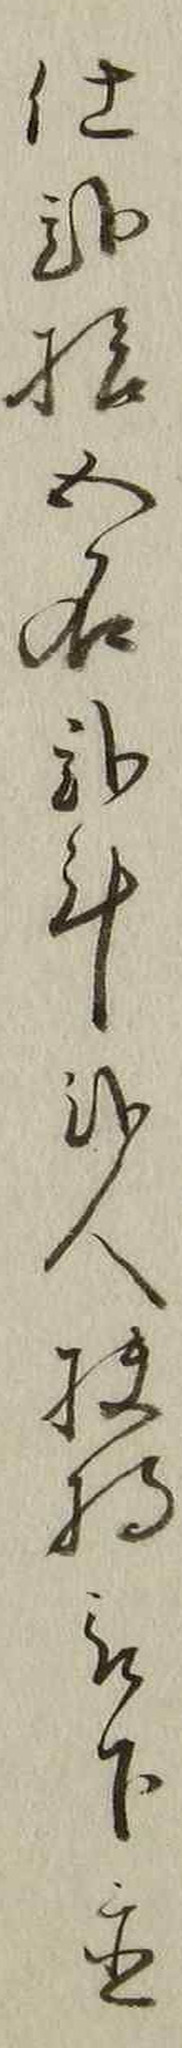仕弐拾五石弐斗弐人扶持被下置
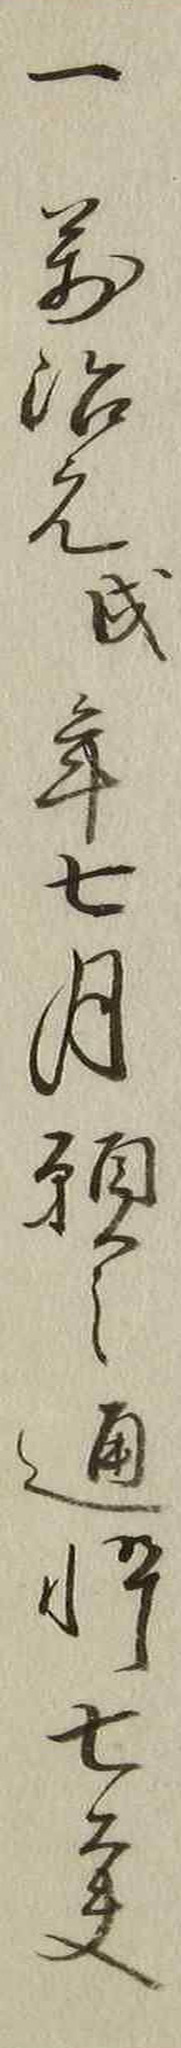一萬治元戌年七月願之通忰七大夫
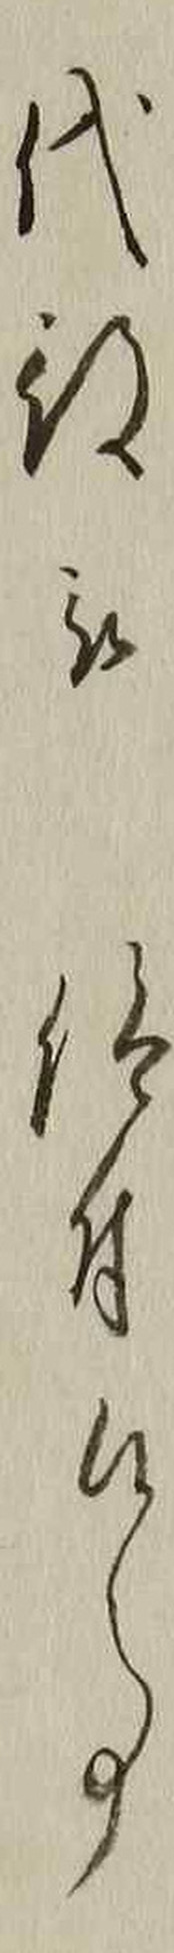代役被仰付候事
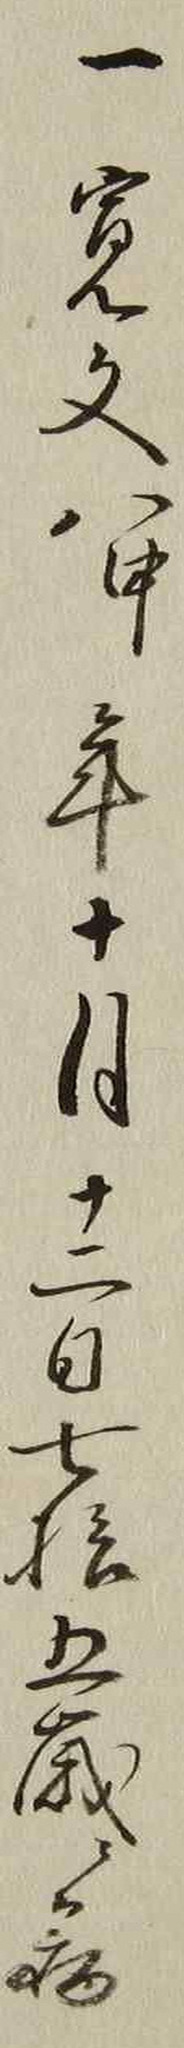一寛文八申年十月十二日七拾五歳ニ候病
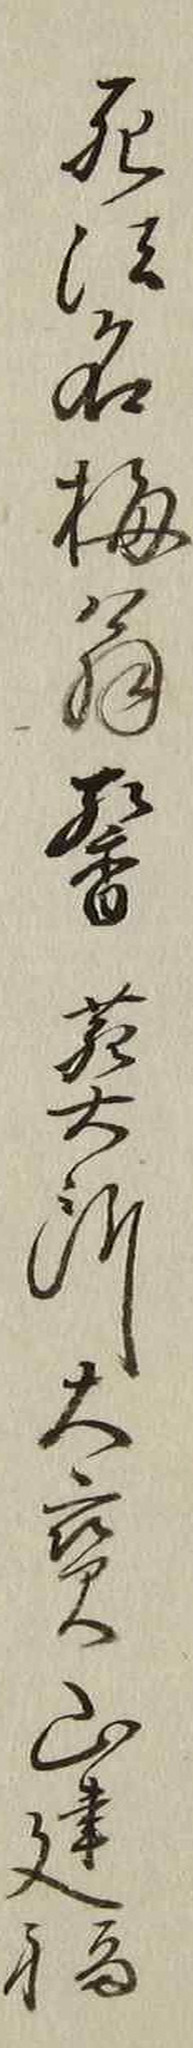死法名梅翁馨葬所大寶山建福
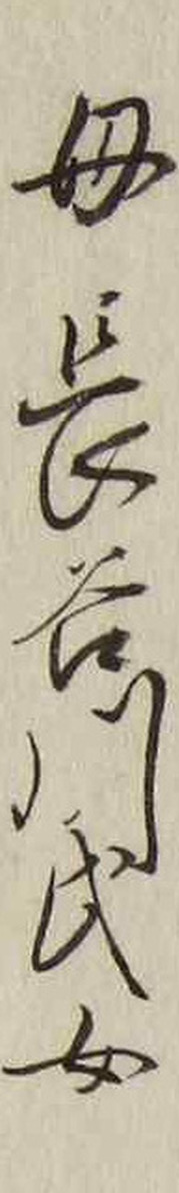母長谷川氏女

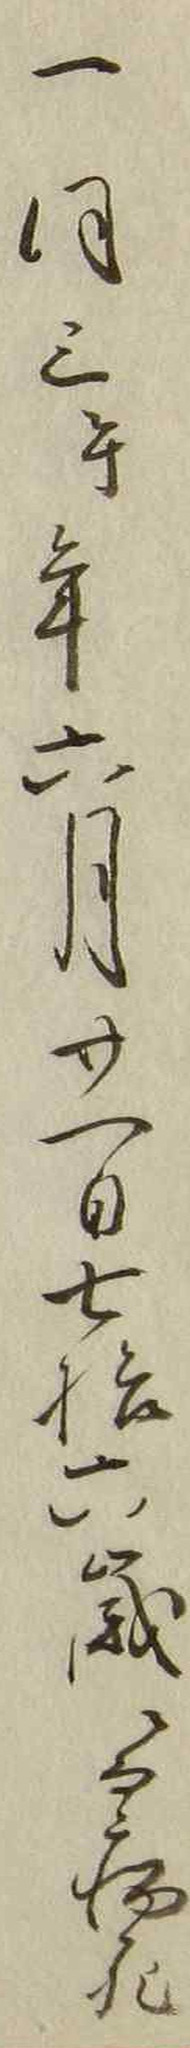一同三午年六月廿一日七拾六歳ニ而病死
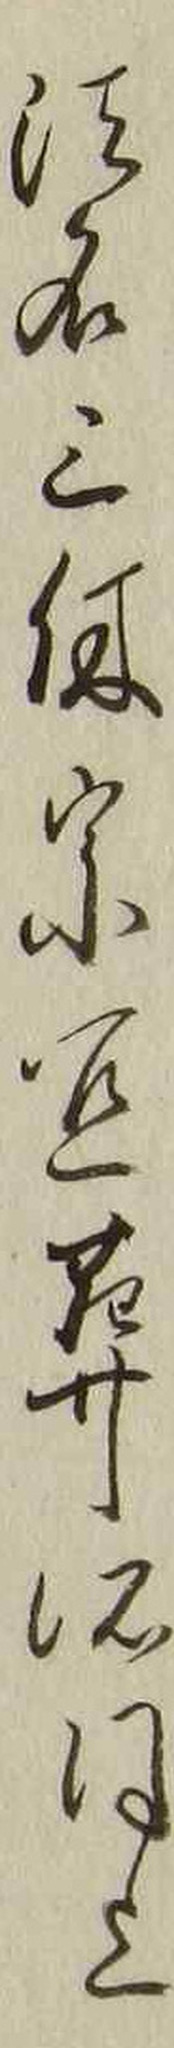法名三休宗宜葬所同上
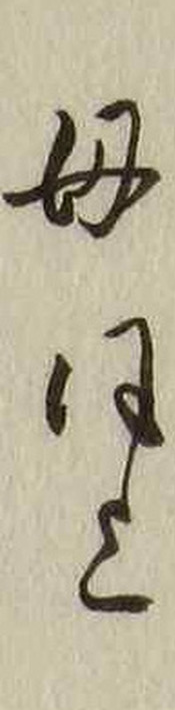母同上
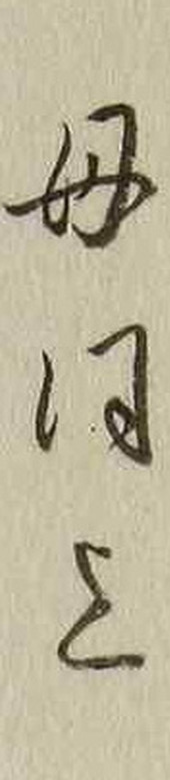母同上
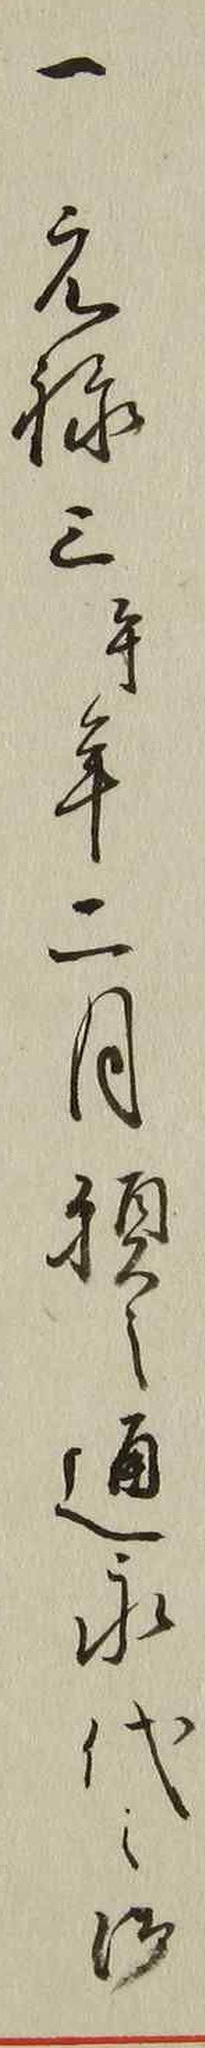一元禄三午年二月願之通永代之御
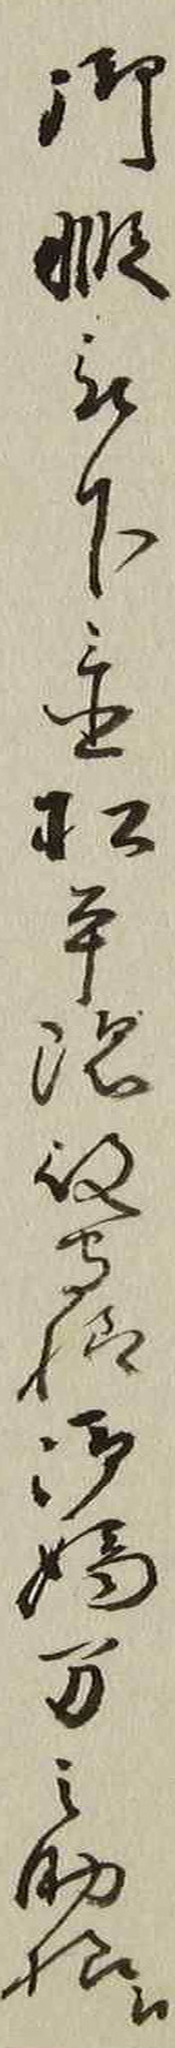御暇被下置松平隠岐守様御嫡万之助様江
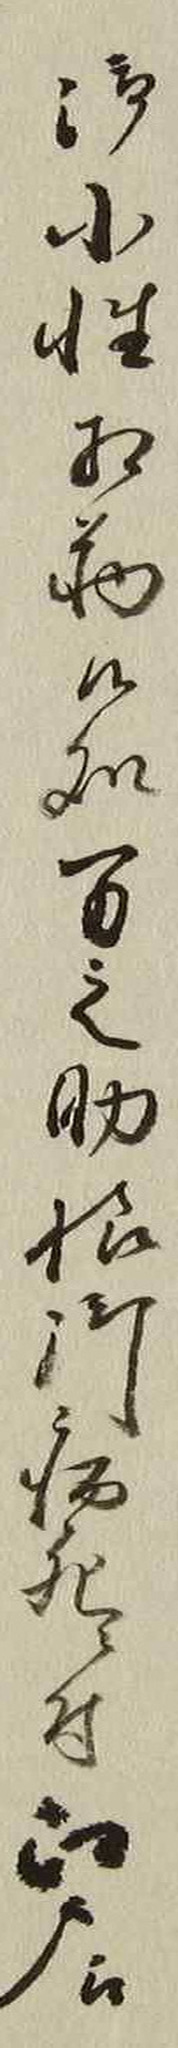御小性相勤候処万之助様御病死ニ付江戸江
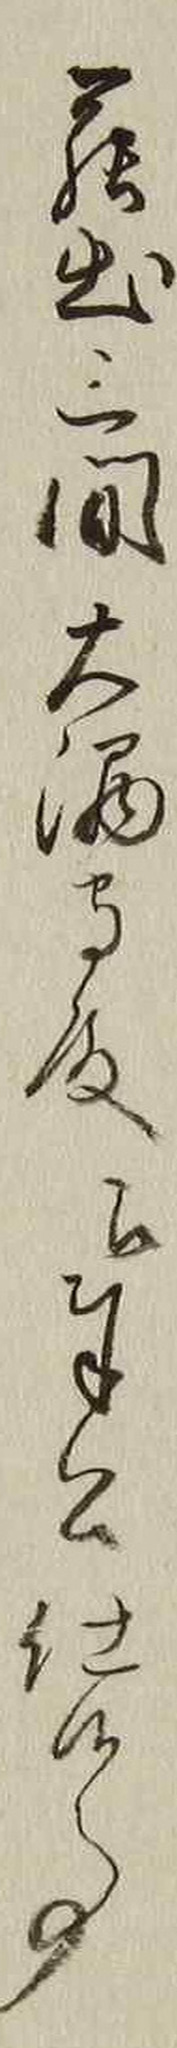罷出三間大隅守殿江奉公仕候事
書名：諸士系譜　巻之6　い之部6
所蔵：会津若松市立会津図書館
